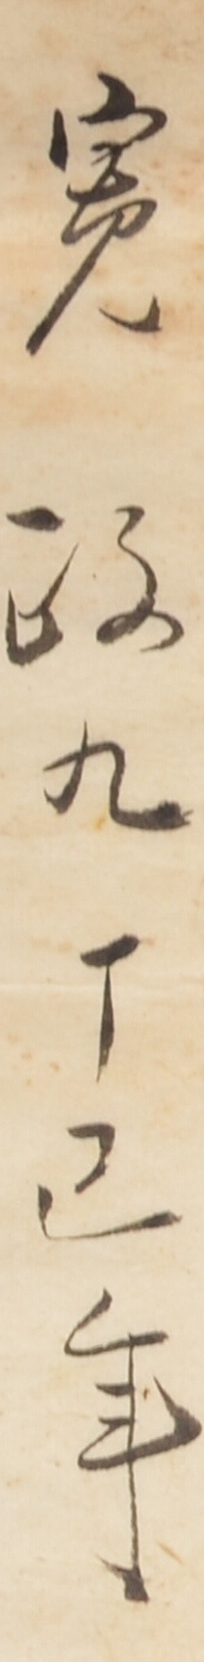寛政九丁巳年
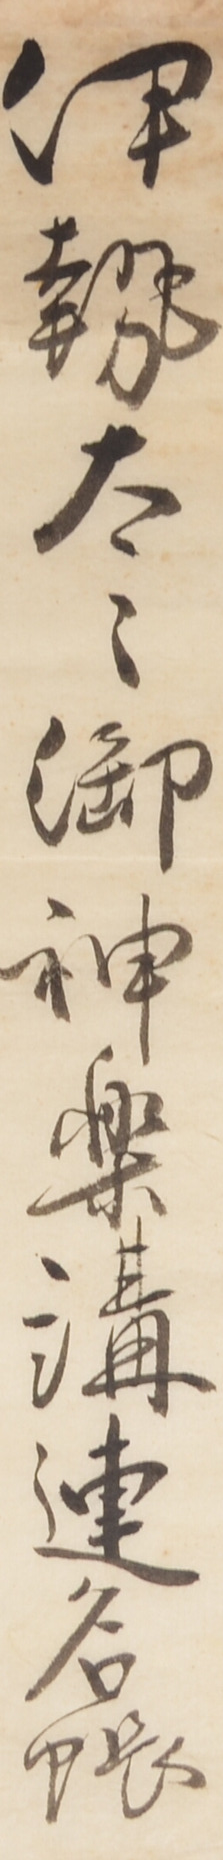伊勢太々御神楽講連名帳
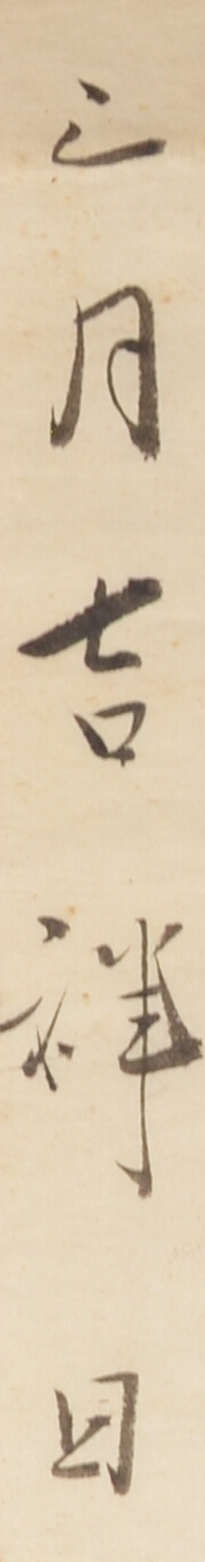三月吉祥日

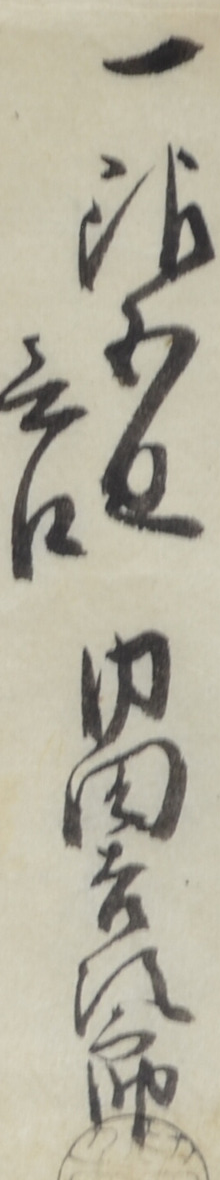一銀五匁内田吉次郎㊞
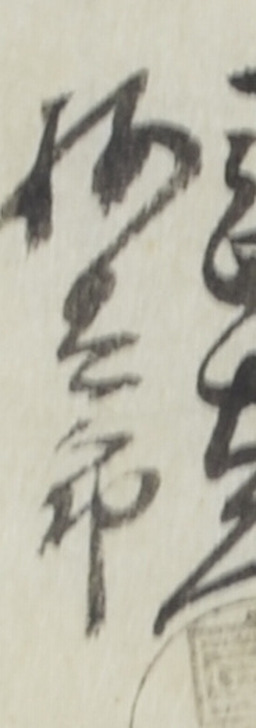梅太郎
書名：伊勢太々御神楽講連名帳
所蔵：伊那市立高遠町図書館・合同会社AMANE
